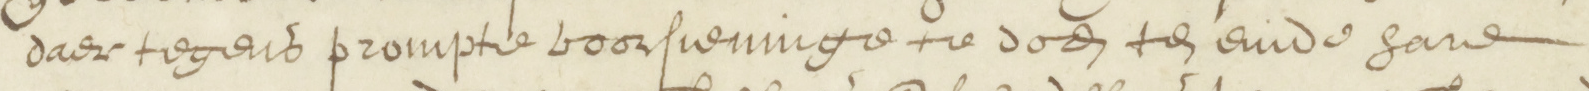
daer tegens prompte voorsieninge te doen ten einde hare
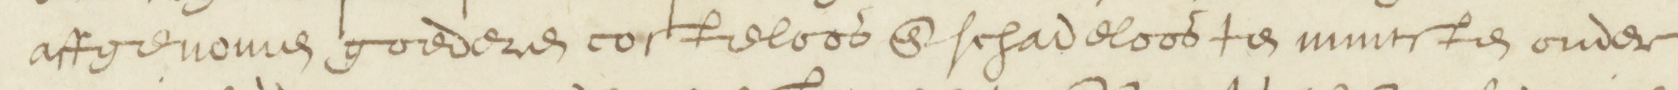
affgenomen goederen costeloos & schadeloos ten minsten onder
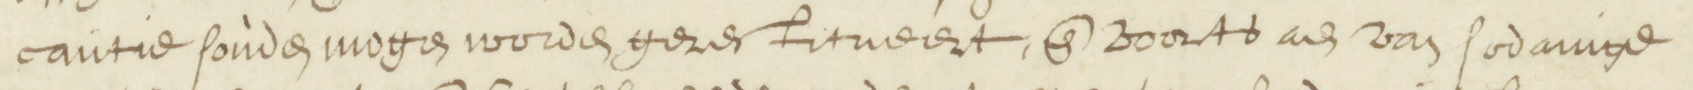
cautie souden mogen worden gerestitueert, & voorts aen van sodanige
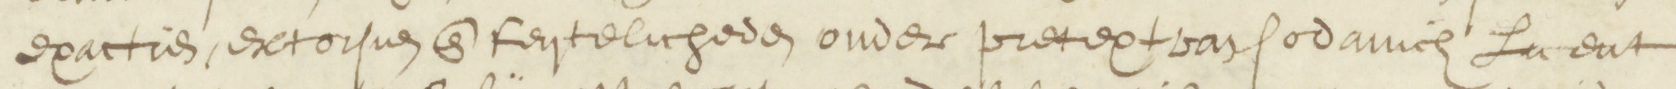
exactien, extorsien & feytelicheden onder pretext van sodanich Licent
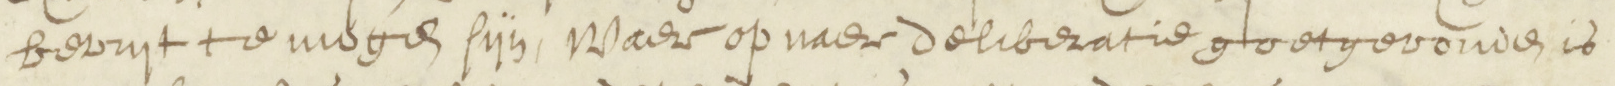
bevryt te mogen sijn, Waer op naer deliberatie goetgevonden is
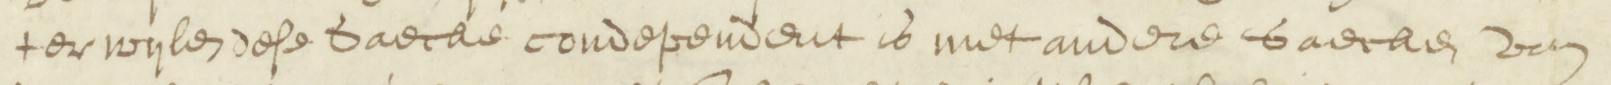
ter wylen dese Saecke condependent is met andere Saecken van
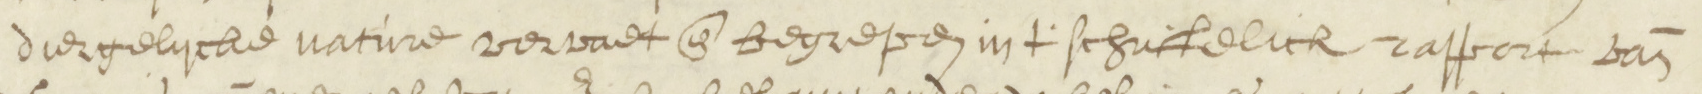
diergelycke nature vervaet & begrepen int‛ schriftelick rapport van
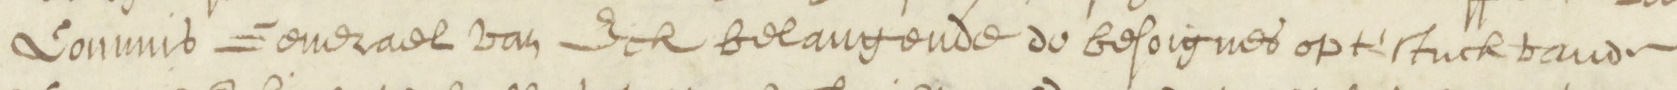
Commis Generael van Eck belangende de besoignes opt‛ stuck vande
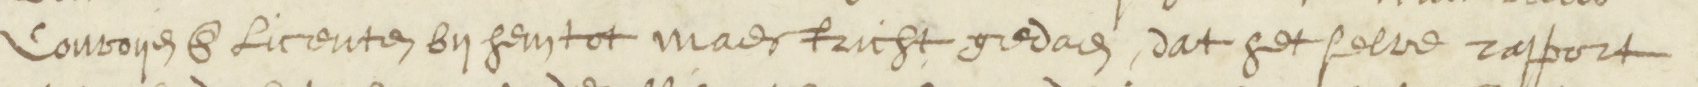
Convoyen & Licenten by hem tot maestricht gedaen, dat het selve rapport
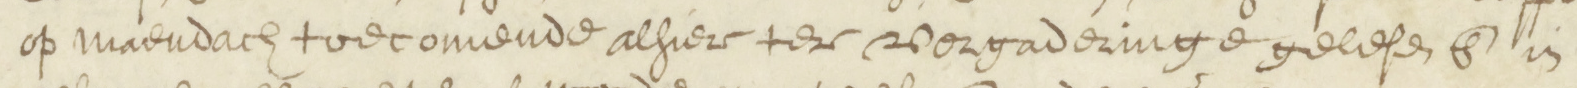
op maendach toecomende alhier ter Vergaderinge gelesen & in
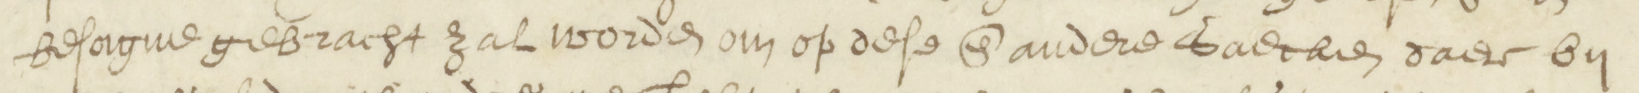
besoigne gebracht zal worden om op dese & andere Saecken daer by
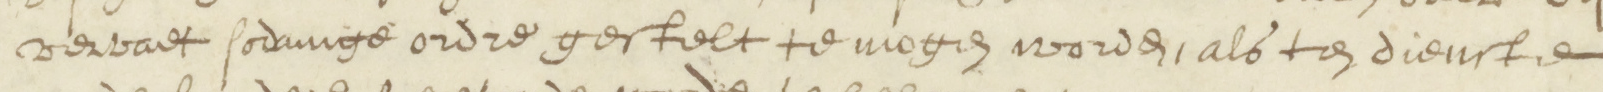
vervaet sodanige ordre gestelt te mogen worden, als ten dienste
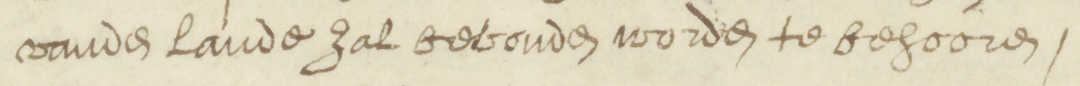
vanden Lande zal bevonden worden te behooren.
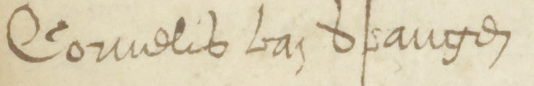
Cornelis van Spangen
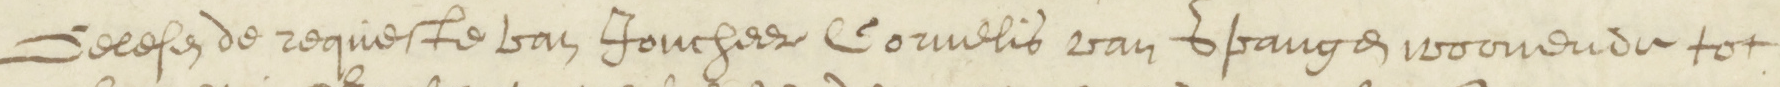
Gelesen de requeste van Joncheer Cornelis van Spangen woonende tot
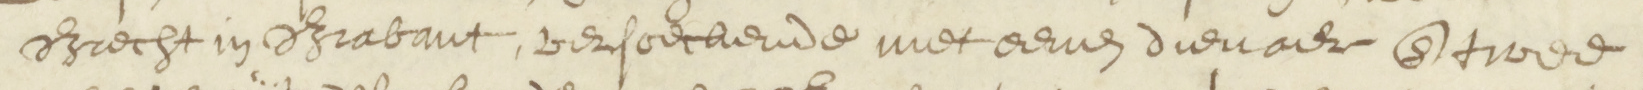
Brecht in Brabant, versoeckende met eenen dienaer & twee
